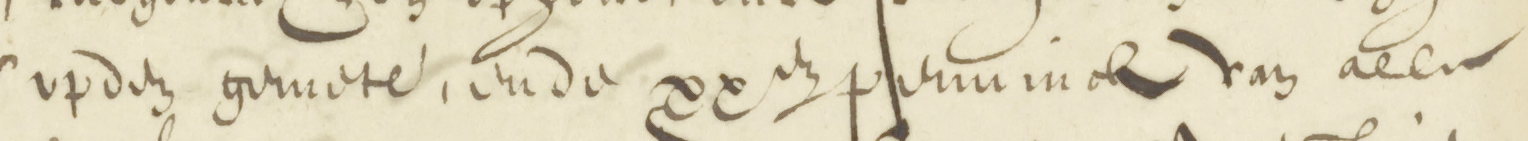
opden gemete, ende xxen penninck van alle
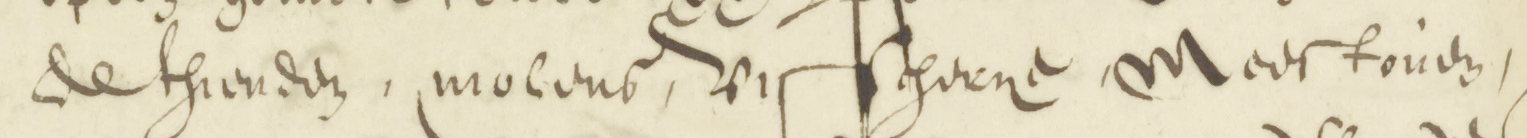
de thienden, molens, visschereye, Meestouen,
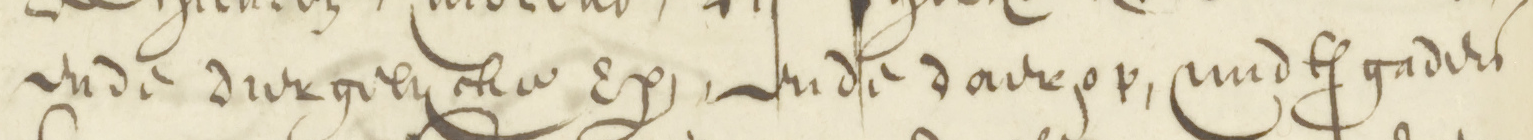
ende diergelycke etc. ende daerop, midtsgaders
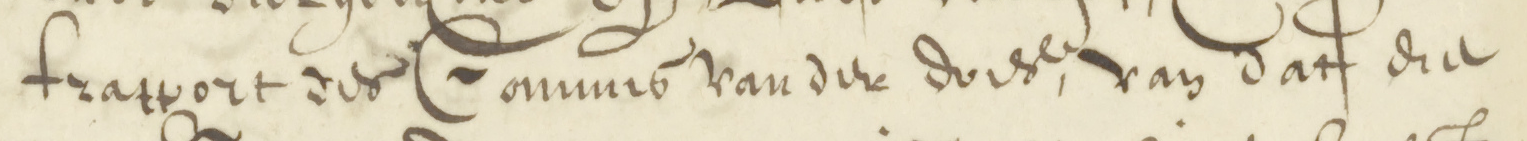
trapport des Commis van der Does, van dat die
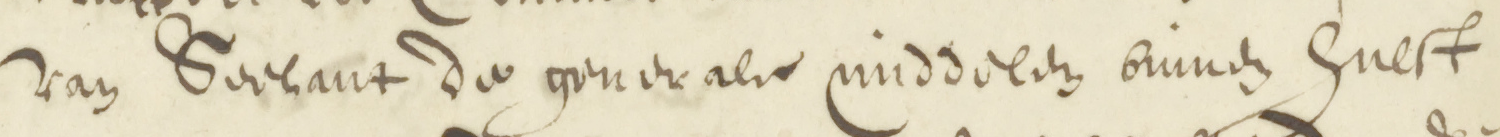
van Seelant de generale middelen binnen Hulst
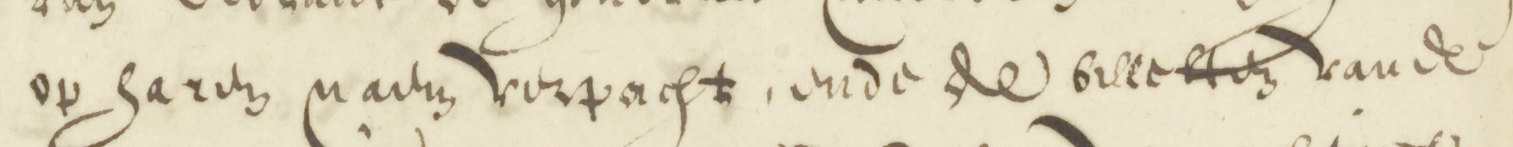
op haren naem verpacht, ende de billetten van de
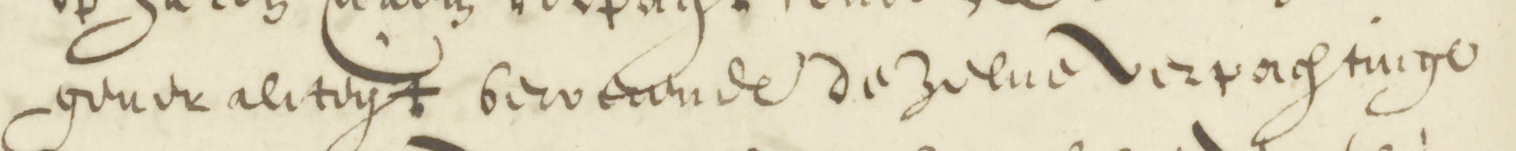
generaliteijt beroerende de zelue verpachtinge
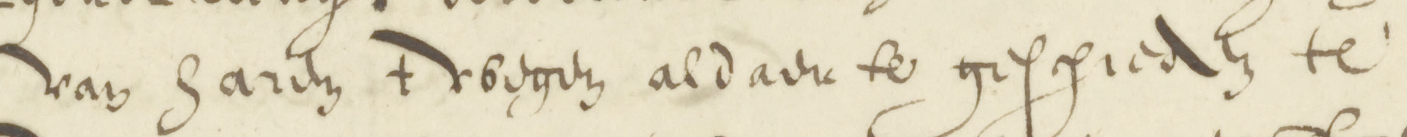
van haren twegen aldaer te geschieden te
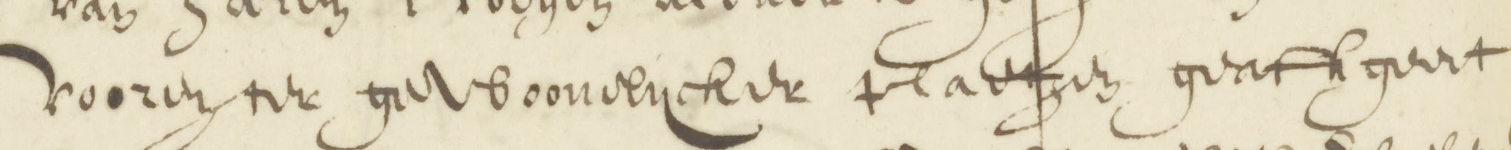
vooren ter gewoonelycker plaetzen geaffigeert
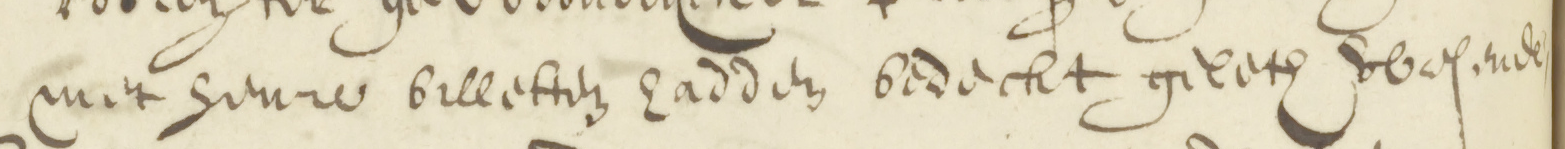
met heure billetten hadden bedeckt geleth wesende
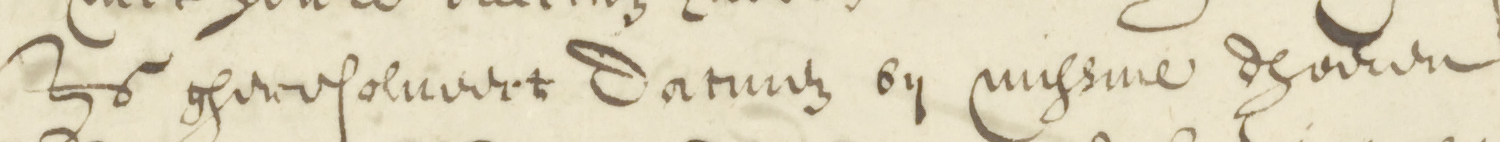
Is geresolueert datmen by missive dheeren
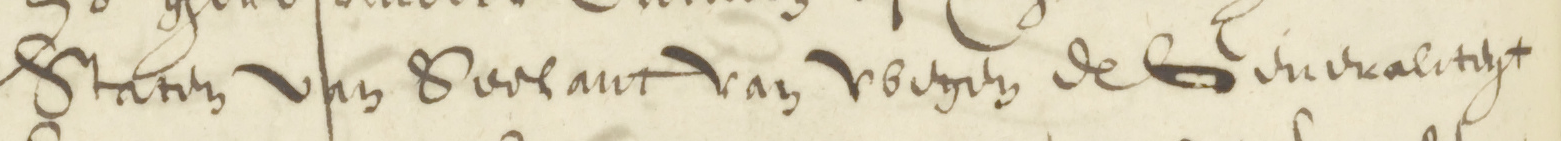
Staten van Seelant van wegen de Generaliteyt
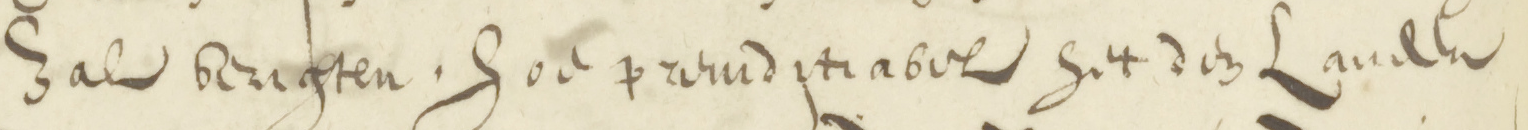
zal berichten, hoe preiuditiabel het den Landen
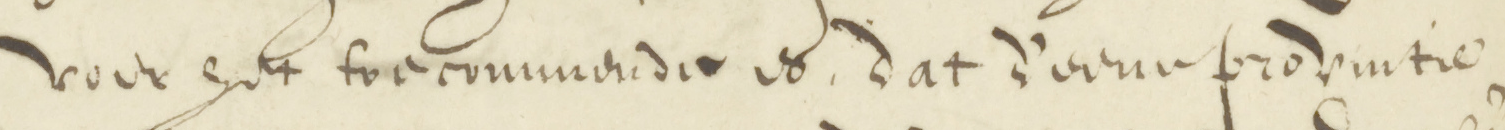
voer het toecommende es, dat d‛eene provintie
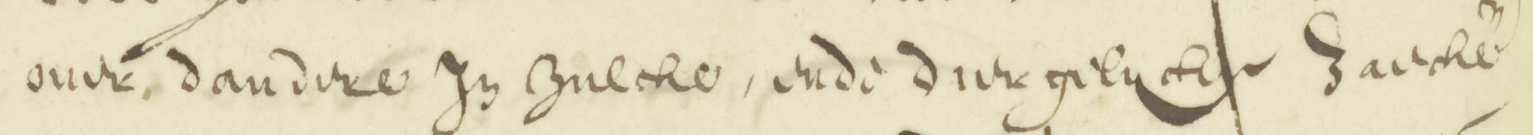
ouer dandere In zulcke, ende diergelycke zaecken
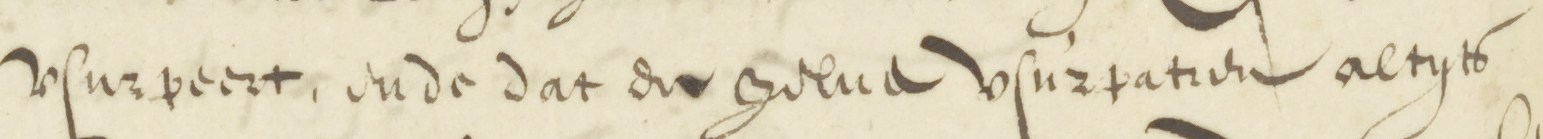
vsurpeert, ende dat de zelue vsurpatien altyts
